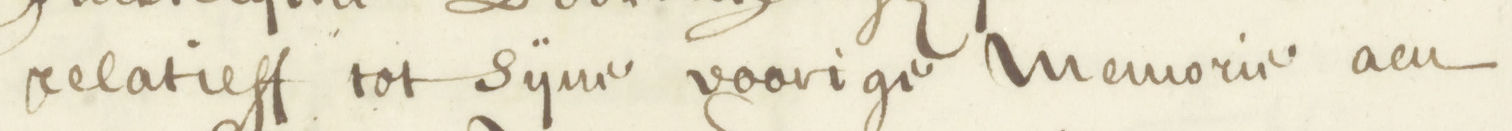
relatieff tot sijne voorige Memorie aen
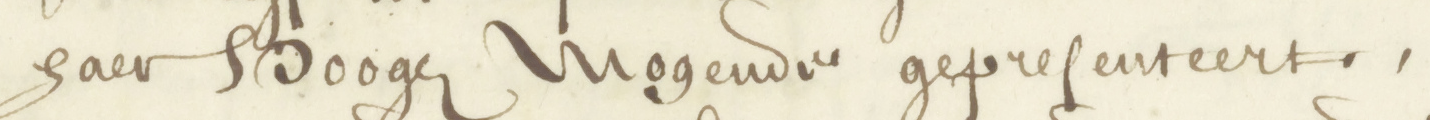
haer Hoogh Mogende gepresenteert,
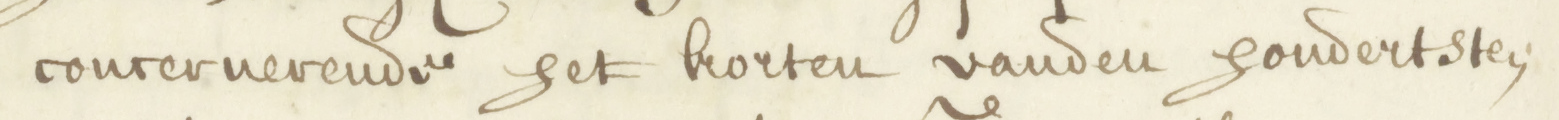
concernerende het korten vanden hondertsten
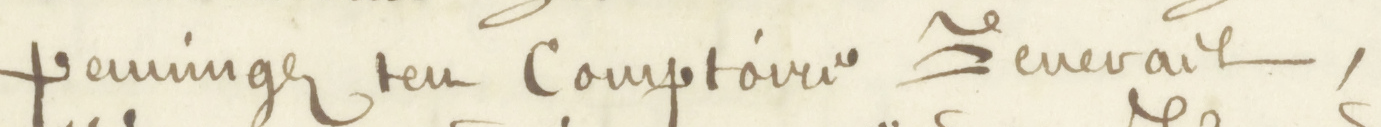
penningh ten comptoire Generael,
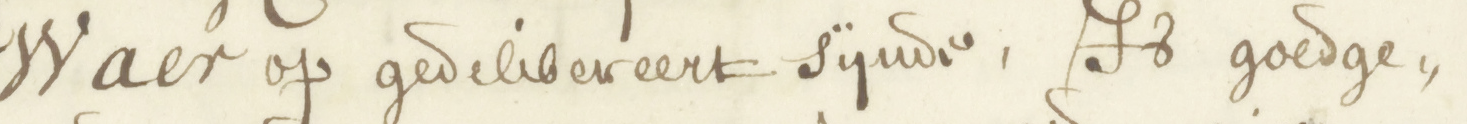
Waer op gedelibereert sijnde, Is goedge„
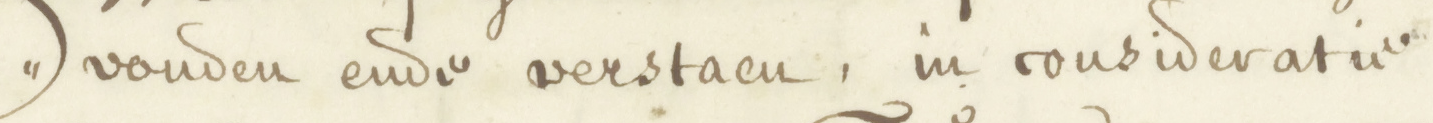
„vonden ende verstaen, in consideratie
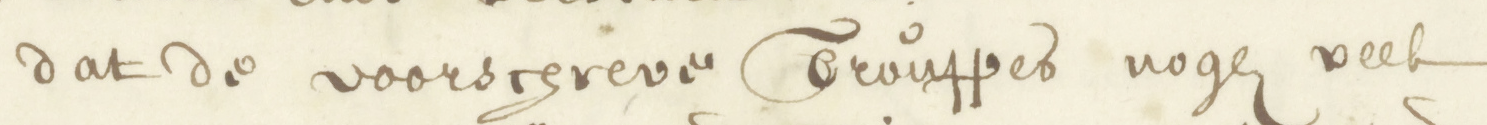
dat de voorschreve Trouppes nogh veel
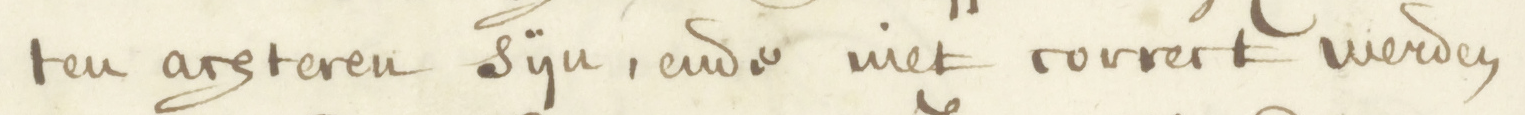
ten achteren sijn, ende niet correct werden
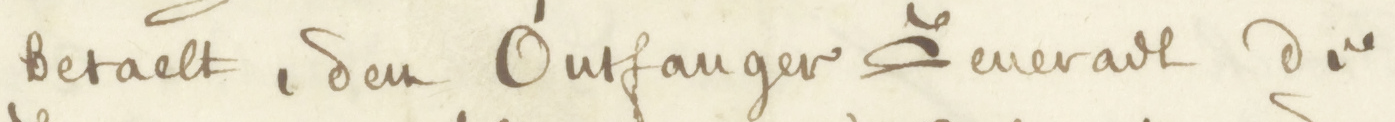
betaelt, den Ontfanger Generael de
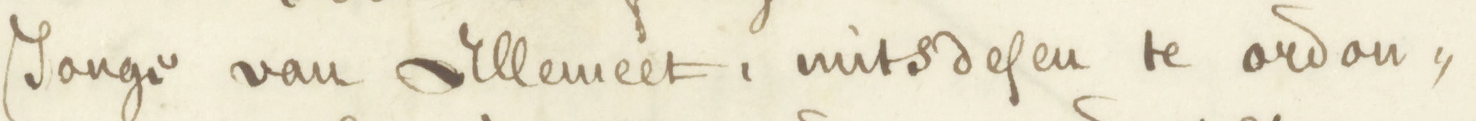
Jonge van Ellemeet, mitsdesen te ordon„
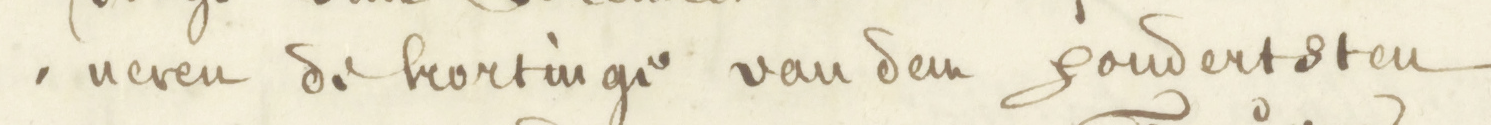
„neren de kortinge van den hondertsten
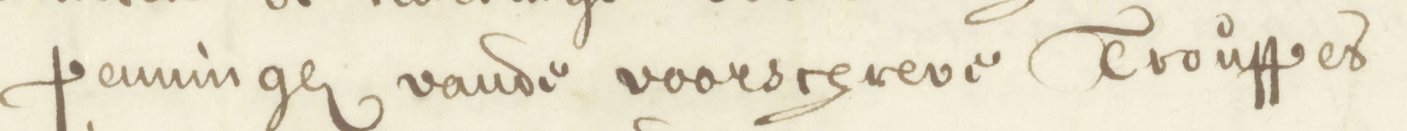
penningh vande voorschreve Trouppes
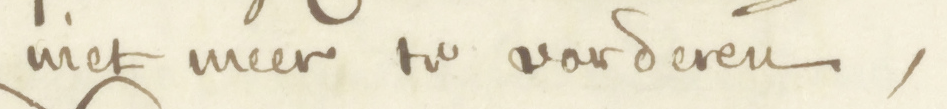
niet meer te vorderen.
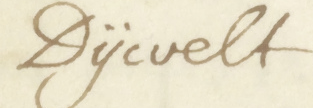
Dijcvelt
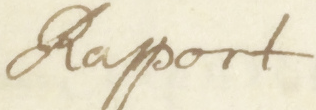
Rapport
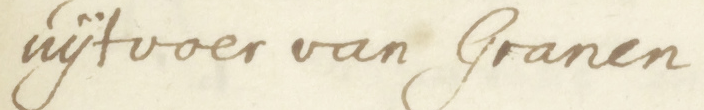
uijtvoer van Granen
